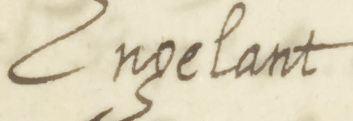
Engelant
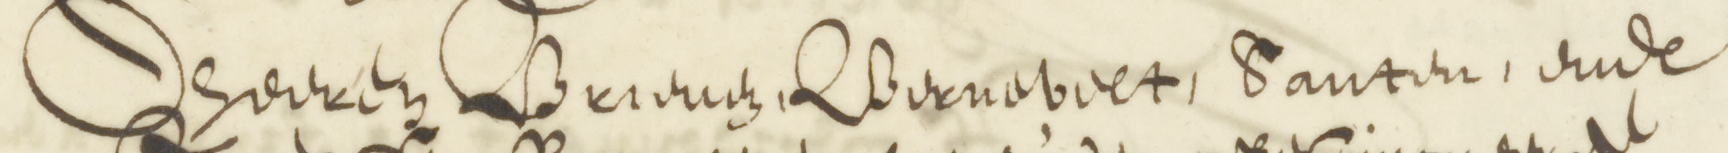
Dheeren Brienen, Bernevelt, Santen, ende
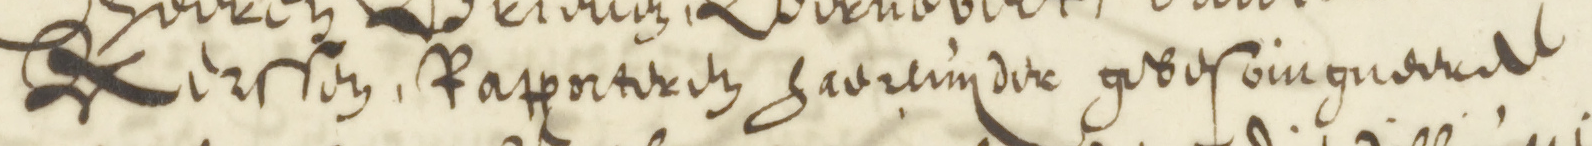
Aerssen, Rapporteren haerluyder gebesoingueerde
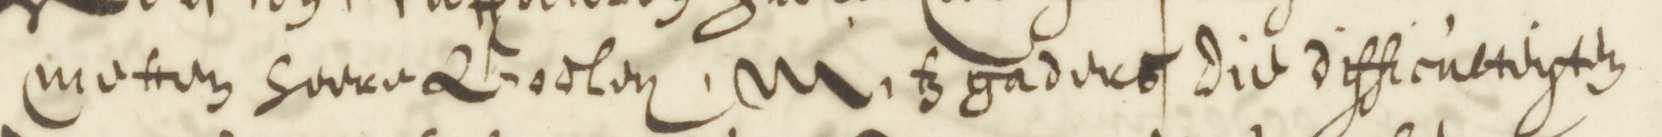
metten heere Bodley, Mitzgaders die difficulteyten
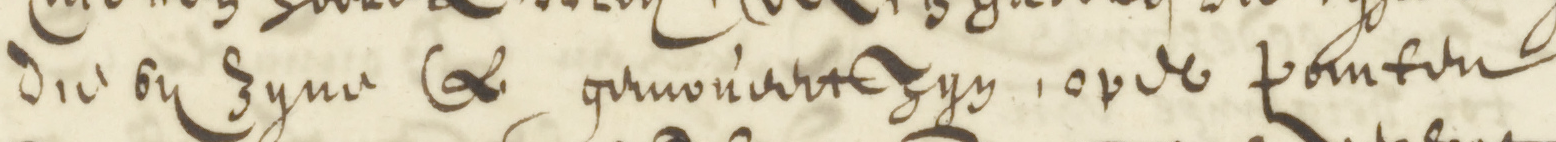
die by zyne E. gemoueert zyn, opde pointen
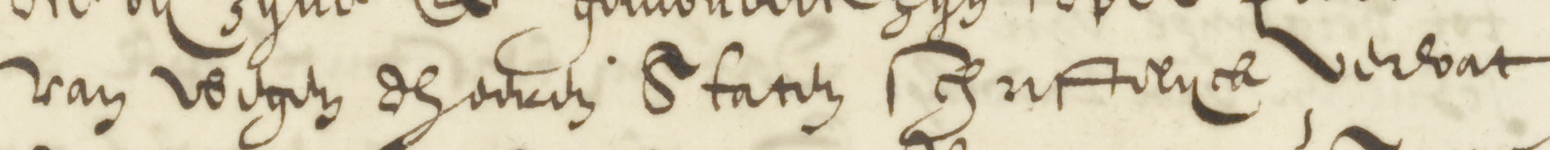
van wegen dheeren Staten schriftelyck vervat
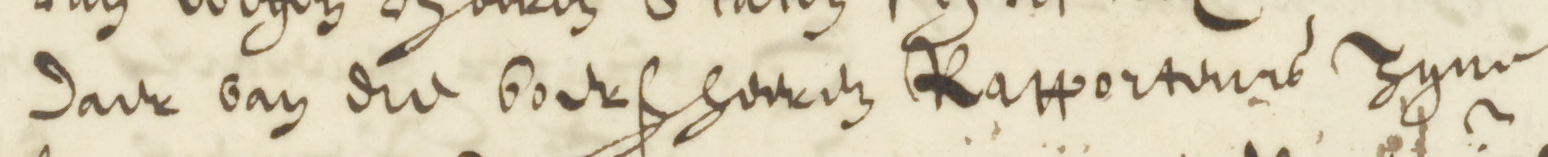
daer van die voers heeren Rapporteurs zyne
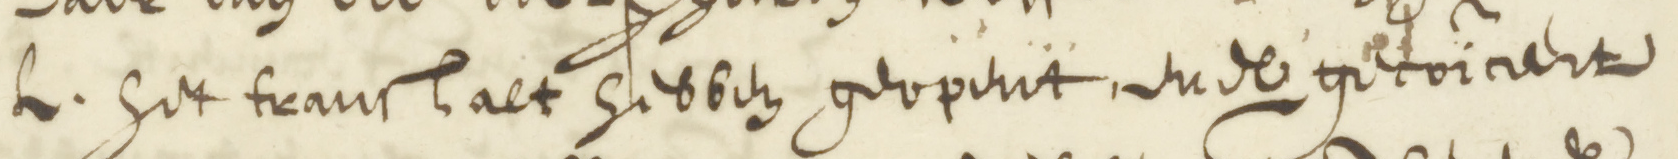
L. het translaet hebben geopent, ende gecoiceert
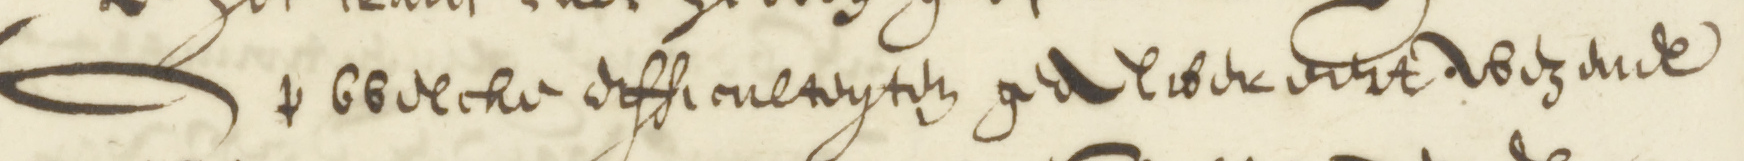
Op welcke difficulteyten gedelibereert wezende
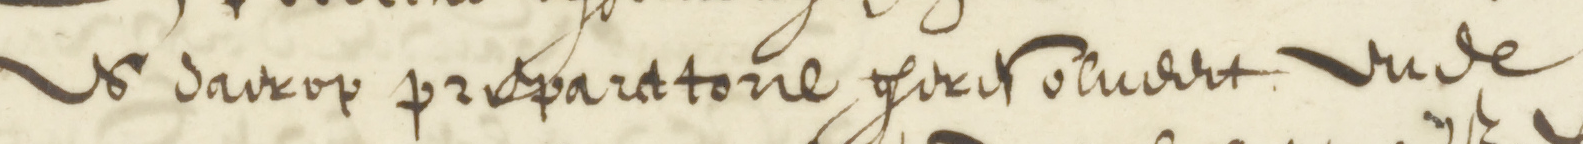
es daerop preparatore gheresolueert ende
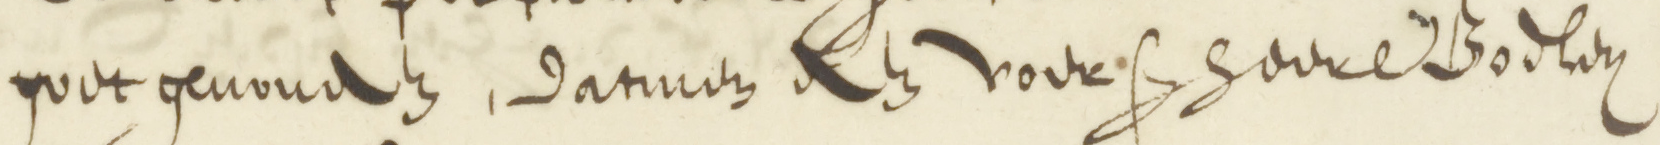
goetgeuonden, datmen den voers heere Bodley
